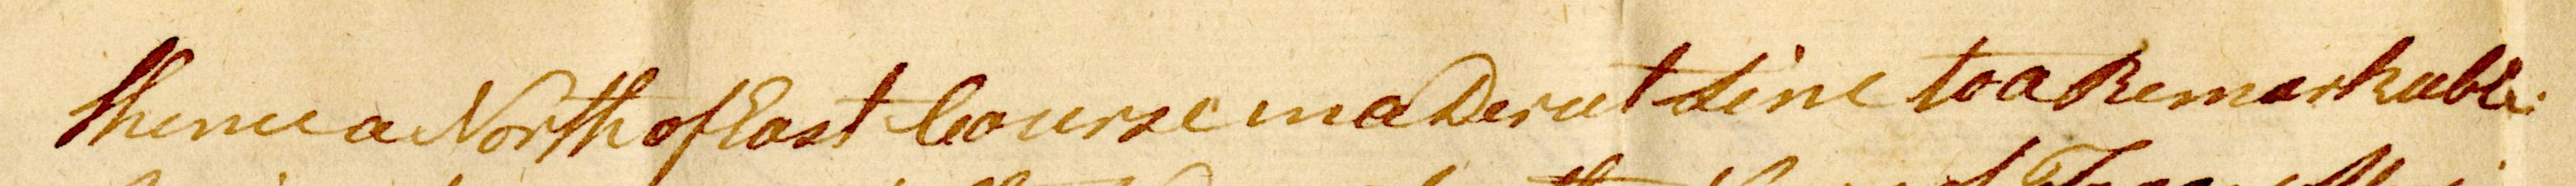thence a North of East Course in a Derect Line to a Remarkable
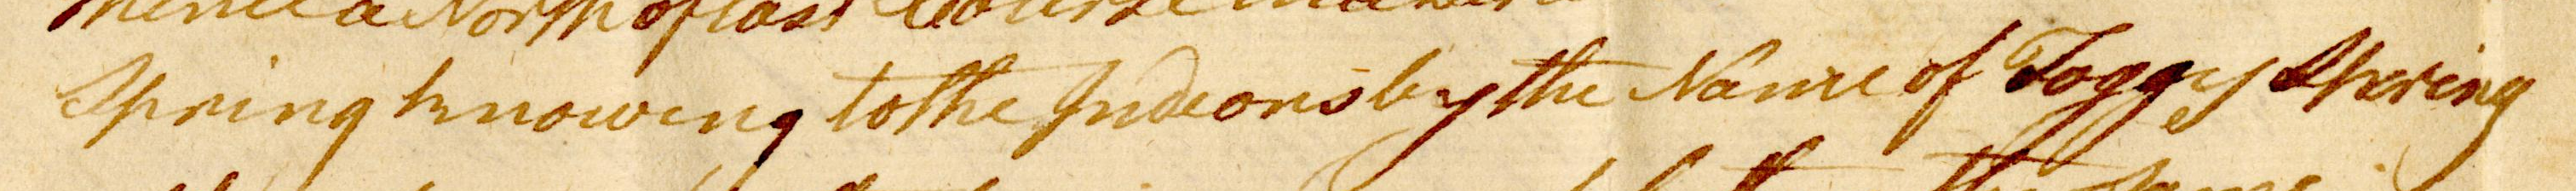spring knowing to the Indians by the Name of Foggy Spring
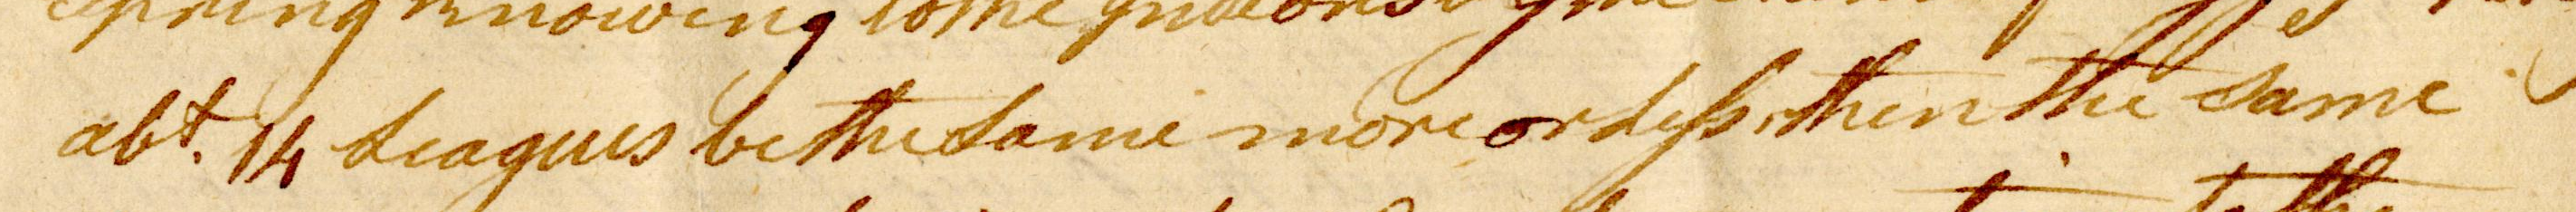ab^t. 14 leagues be the Same more or less then the same
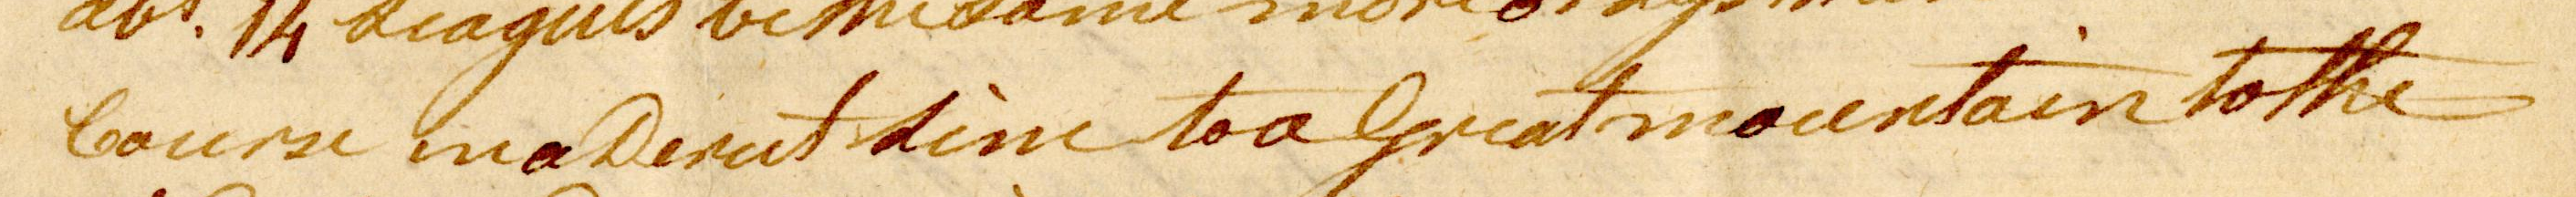Course in a Derect Line to a Great mountain to the
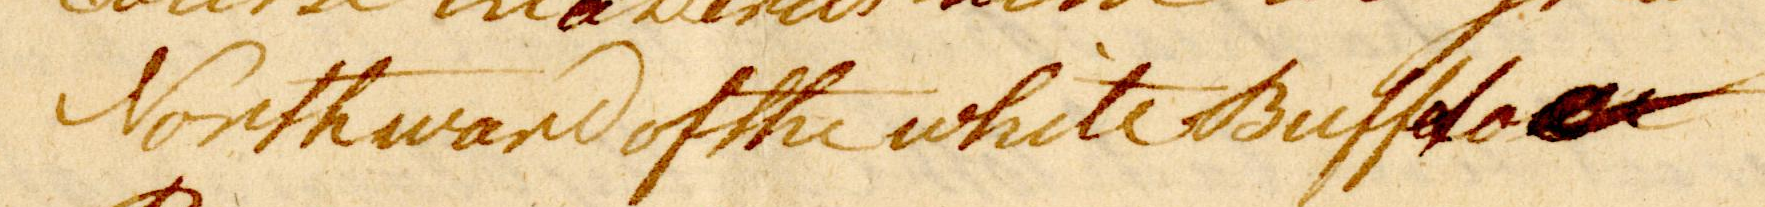Northward of the white Buffalo
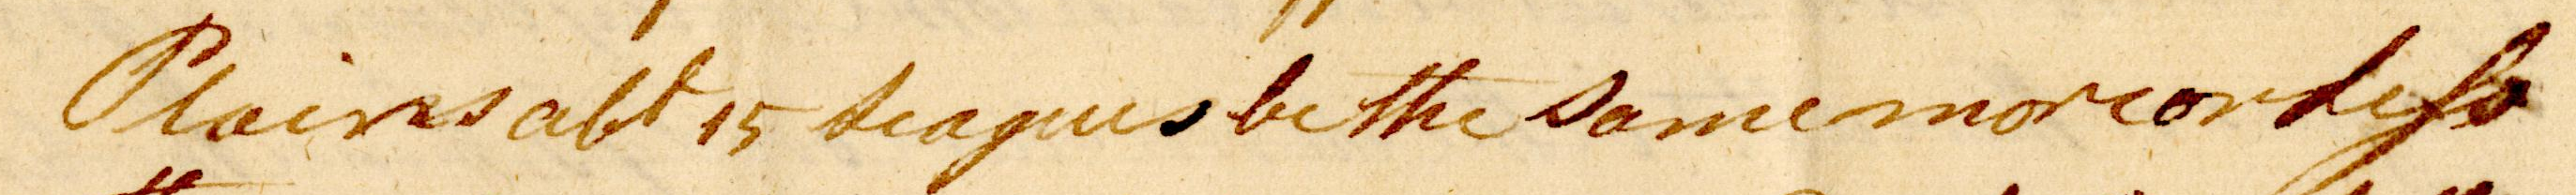Plains ab^t 15 leagues be the same more or less
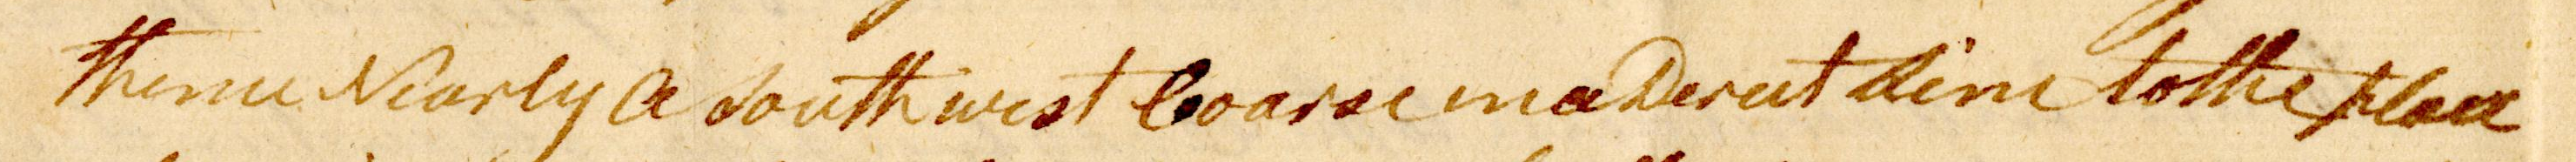thence Nearly a southwest Coarse in a Derect Line to the place
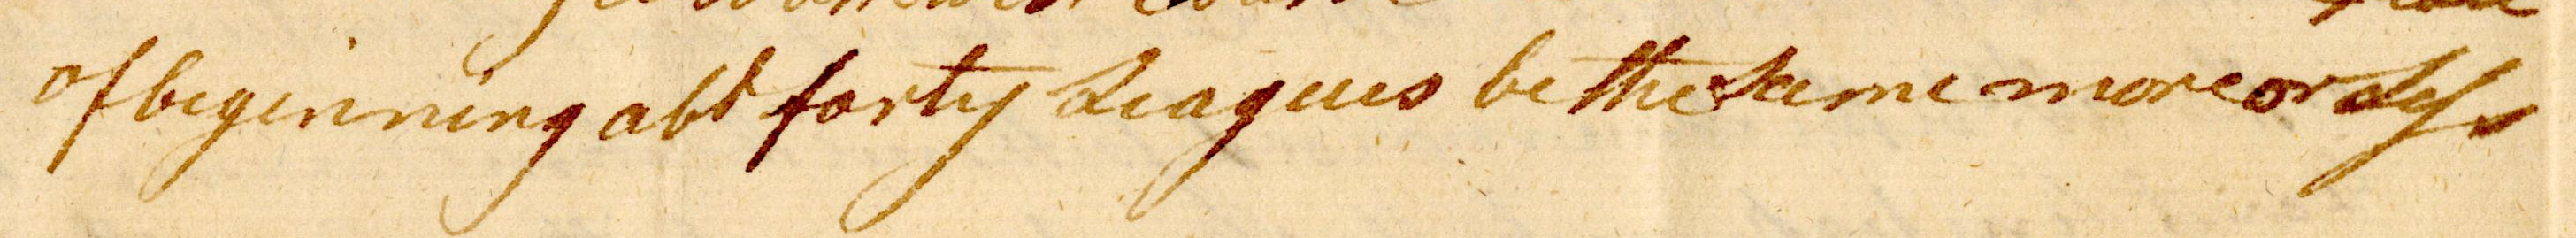of beginning ab^t forty leagues be the same more or less.
